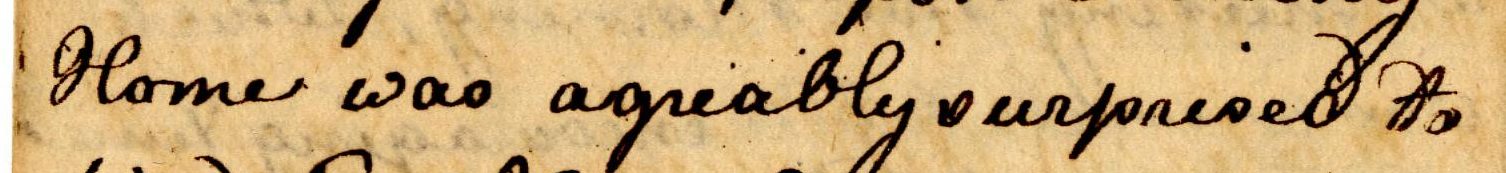Home was agreably surprised to
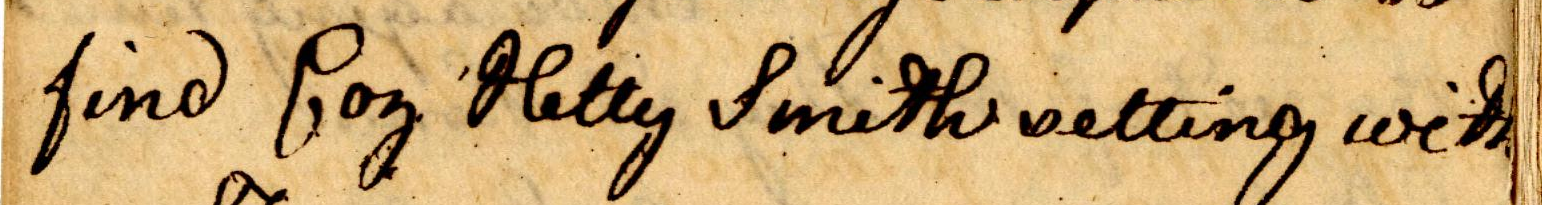find Coz Hetty Smith setting with
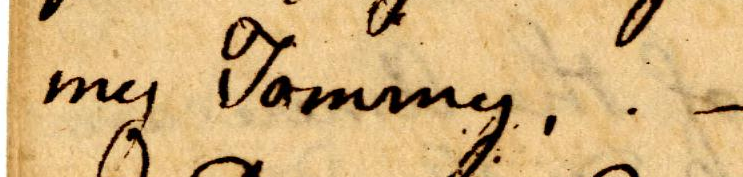my Tommy.
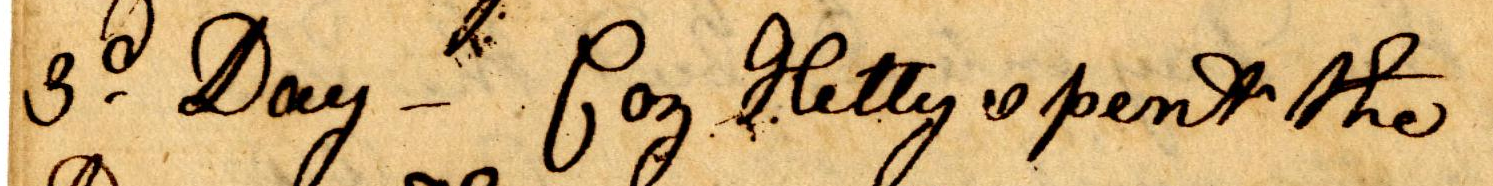3^d. Day- Coz Hetty spent the
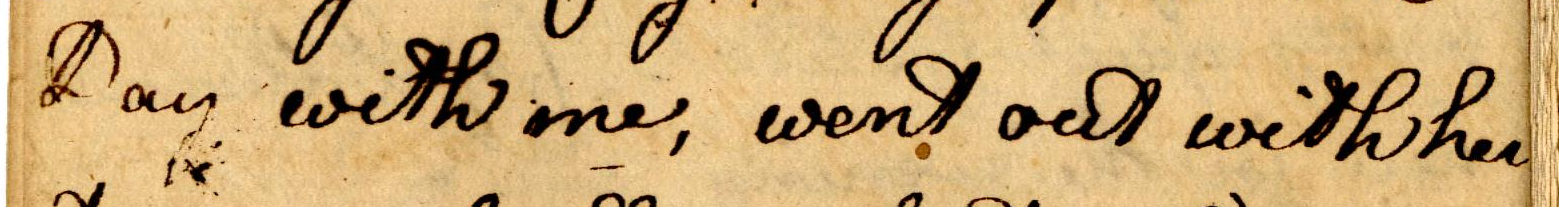Day with me, went out with her
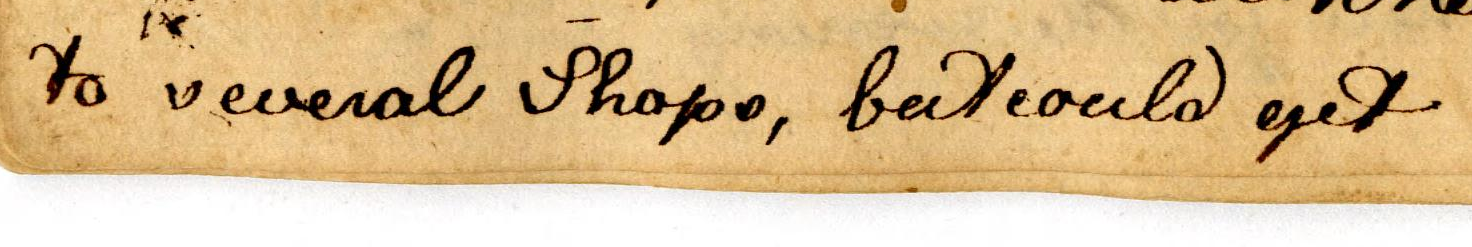to several Shops, but could yet
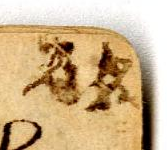47
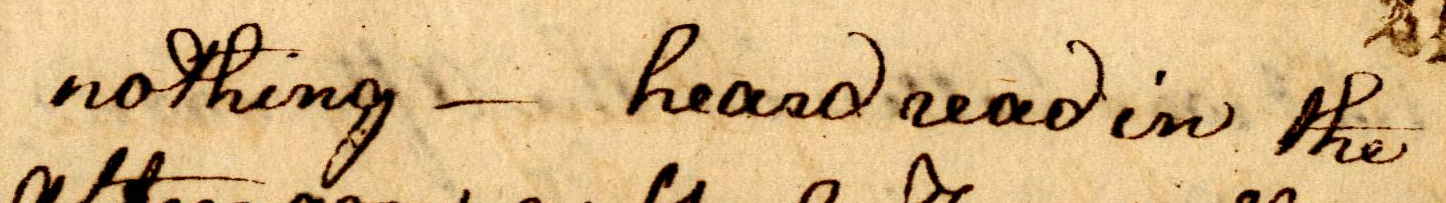nothing- heard read in the
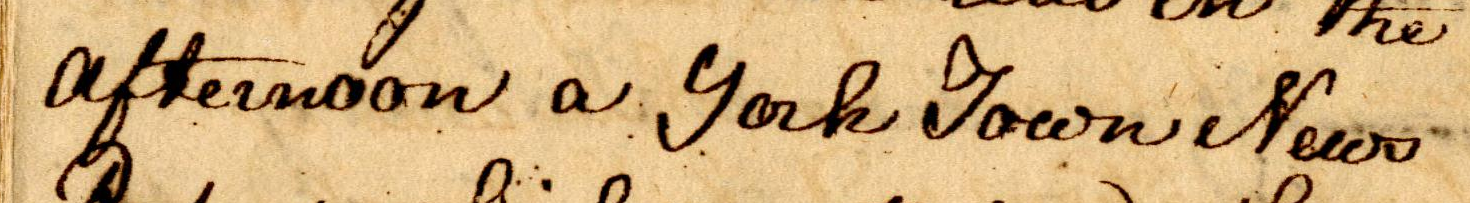Afternoon a York Town News
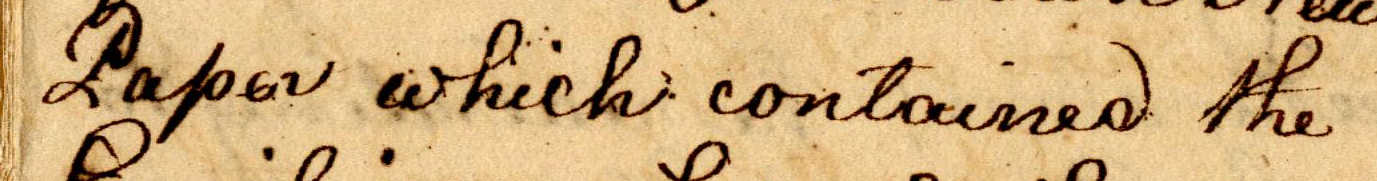Paper which contained the
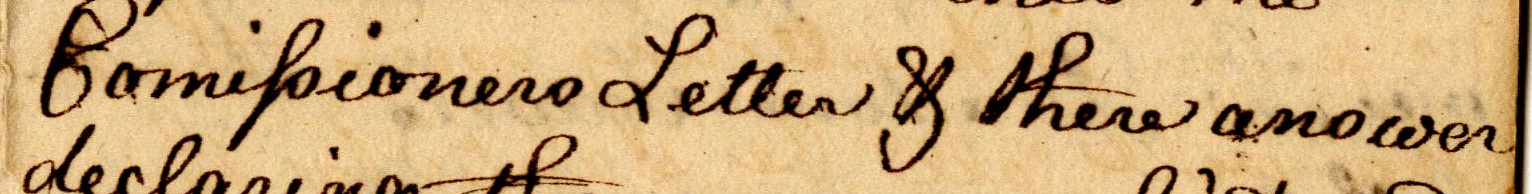Comissioners Letter & there answer
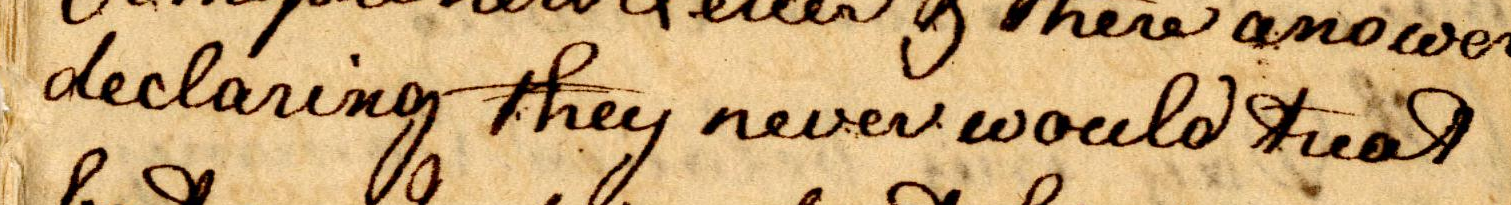declaring they never would treat
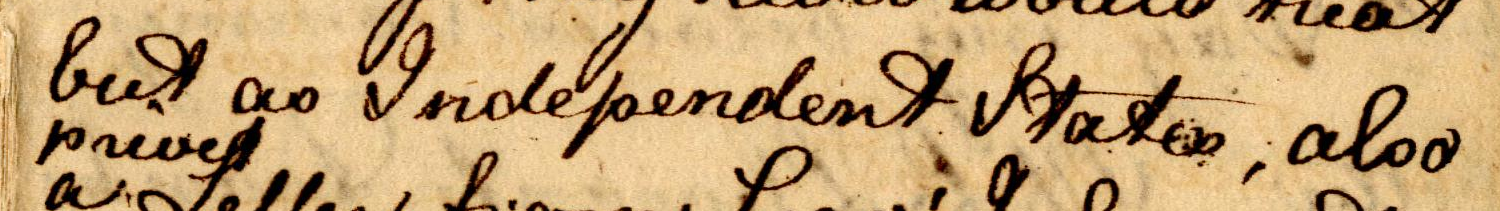but as Independent States, also
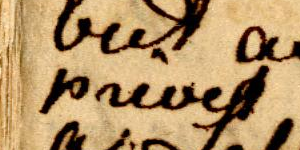privet
